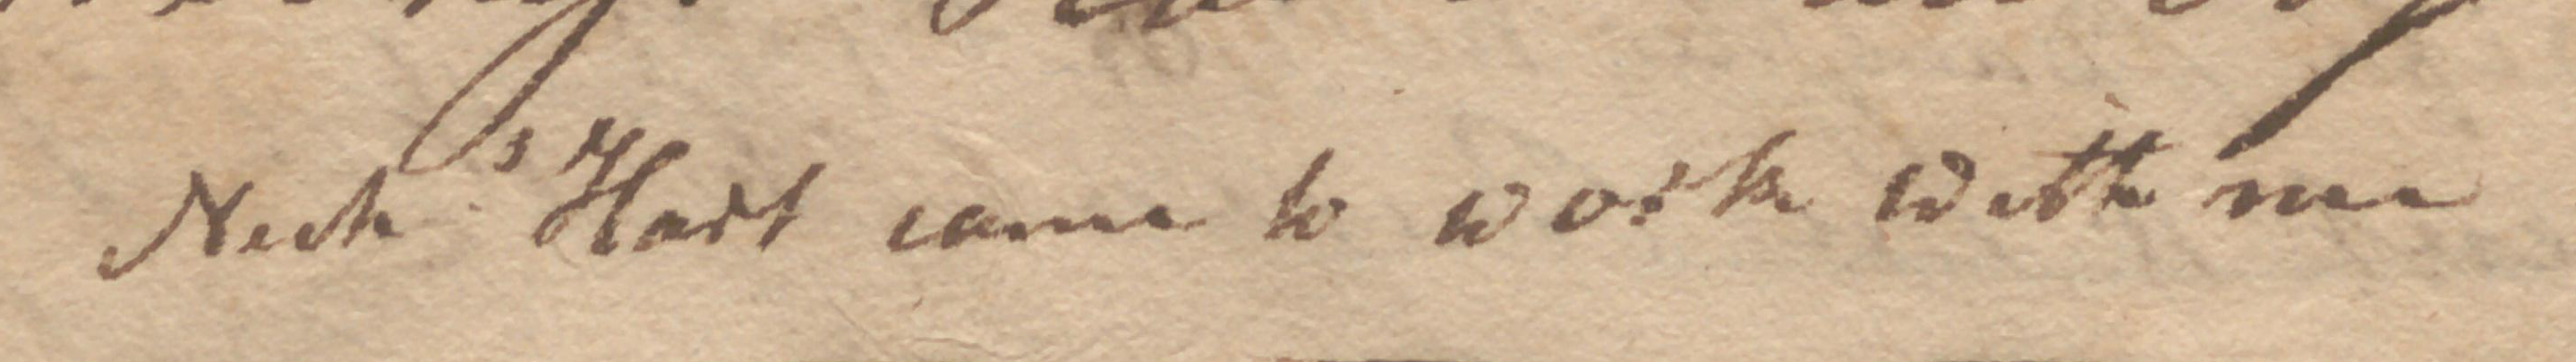Nich^s. Hart came to work with me
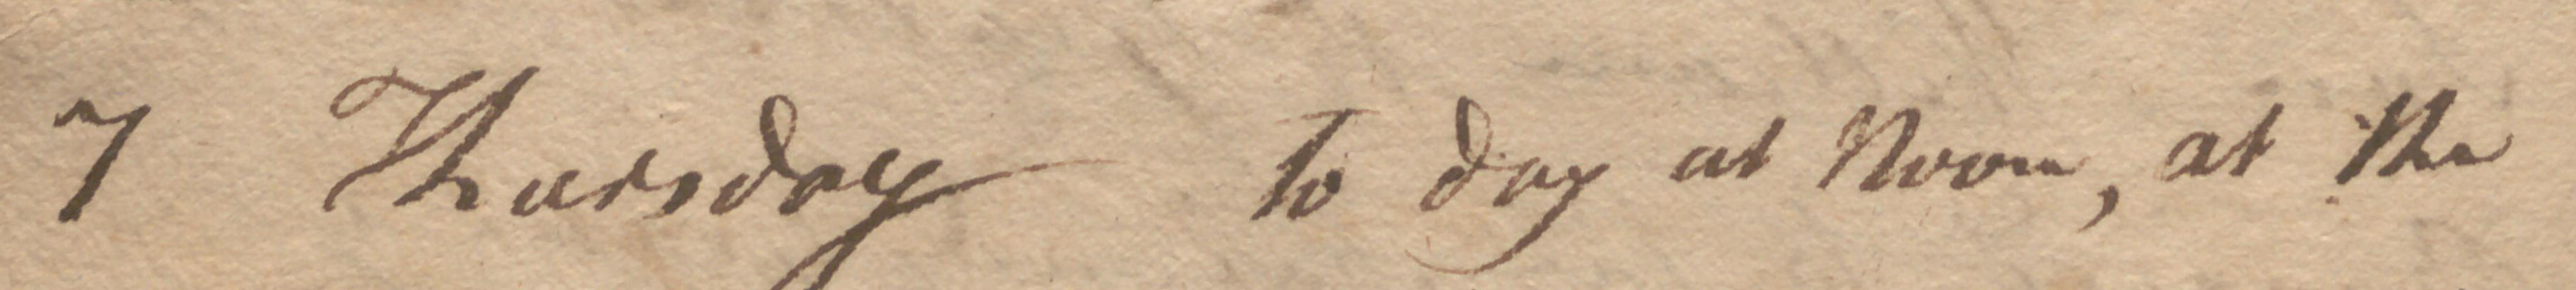7 Thursday to day at noon at the
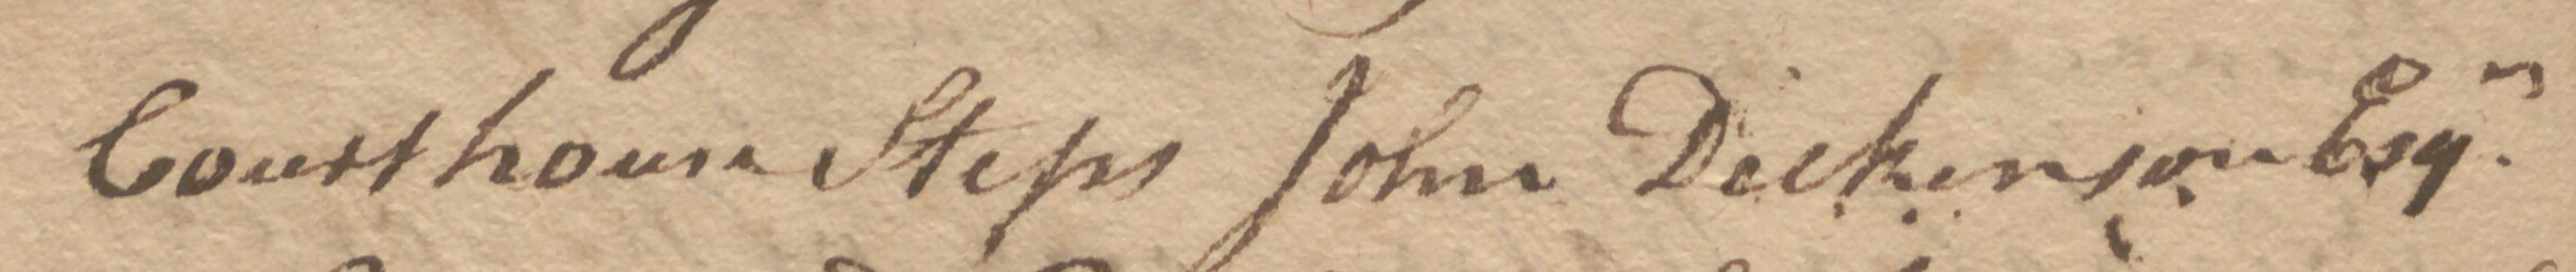Courthoure Steps John Dickinson Esq^r.
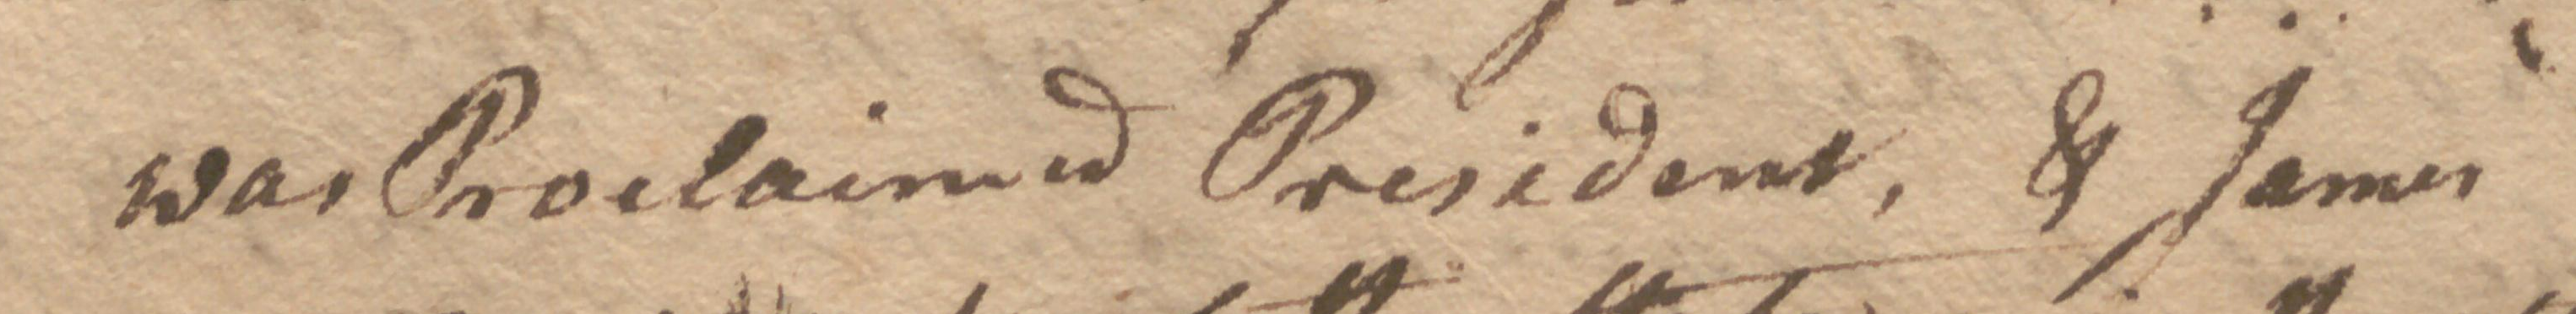was Proclaimed President, & James
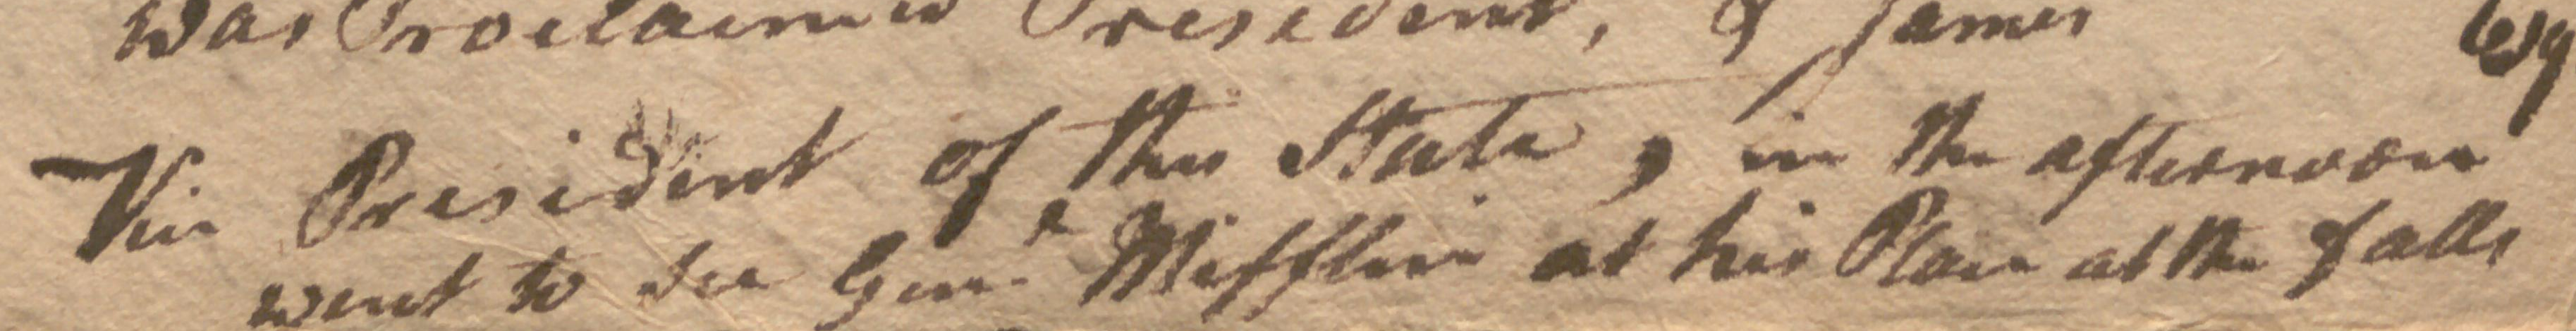Vice President of this State, in the afternoon
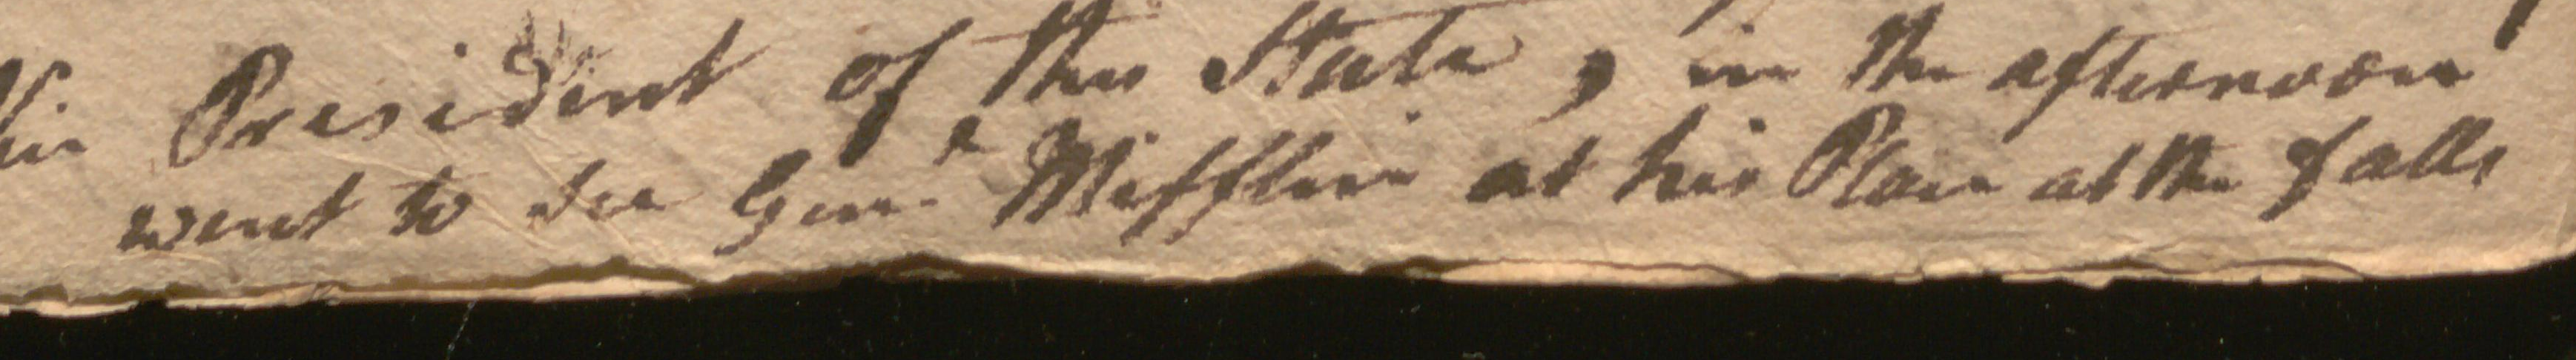went to see Gen^l. Mifflin at his Plan at the falls
